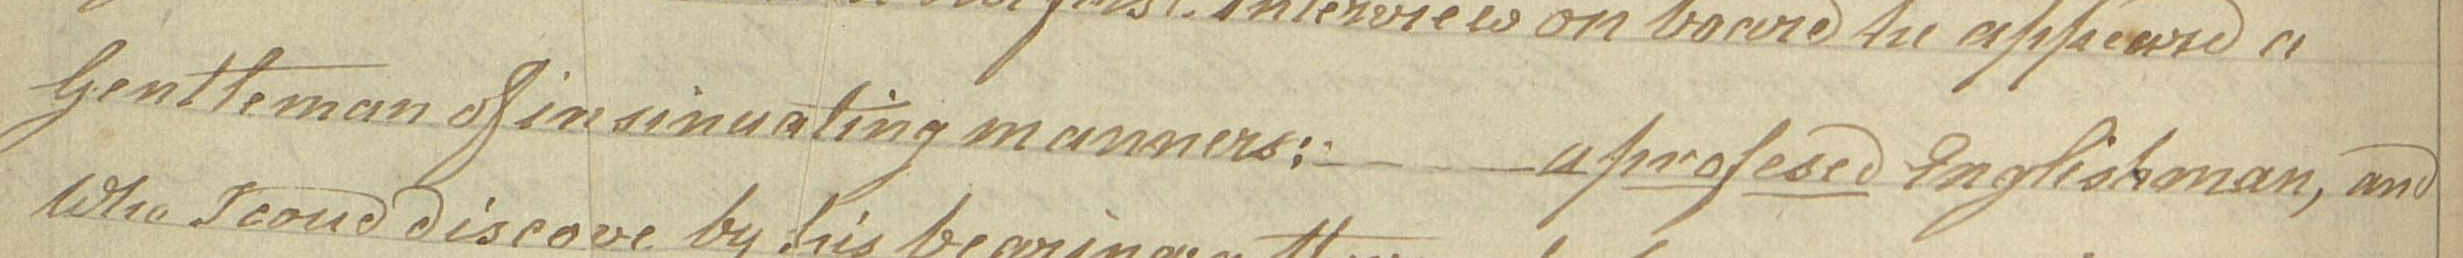Gentleman of insinuating manners; a profesed Englishman, and
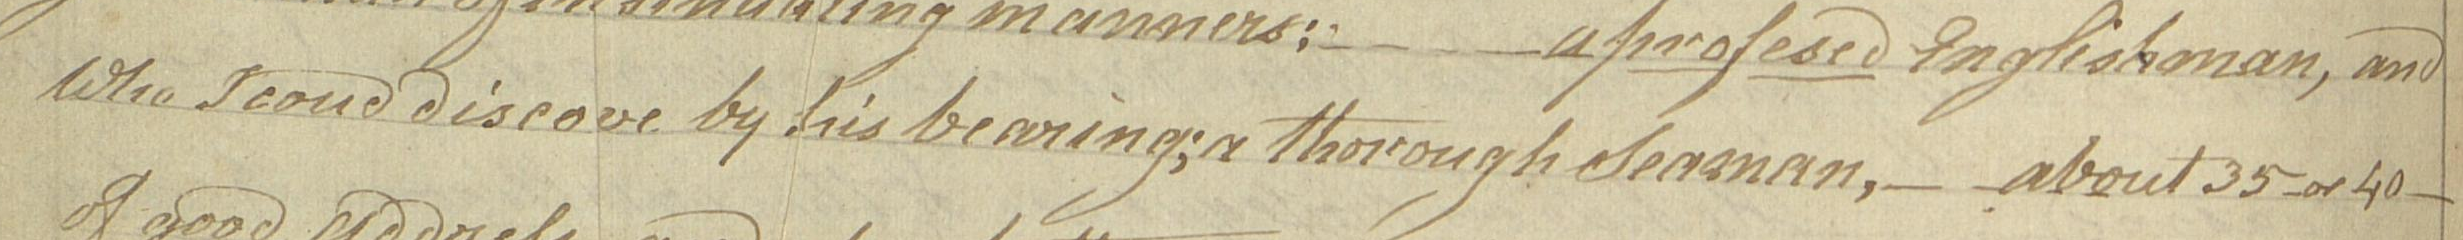Who I coud discove by his bearing; a thorough Seaman, about 35 or 40
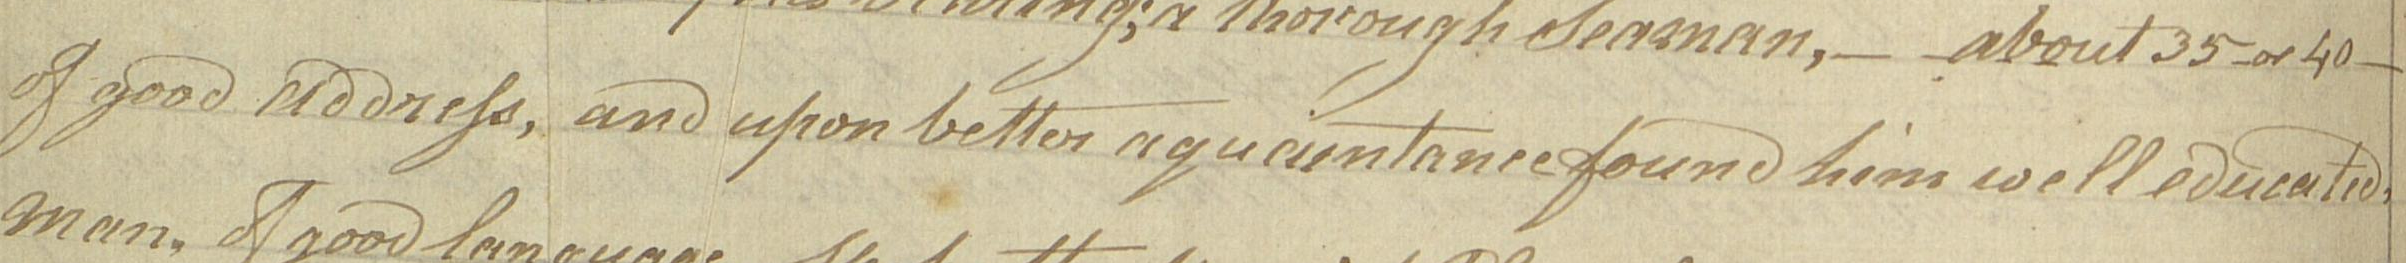of good Address, and upon better aquaintance found him well educated
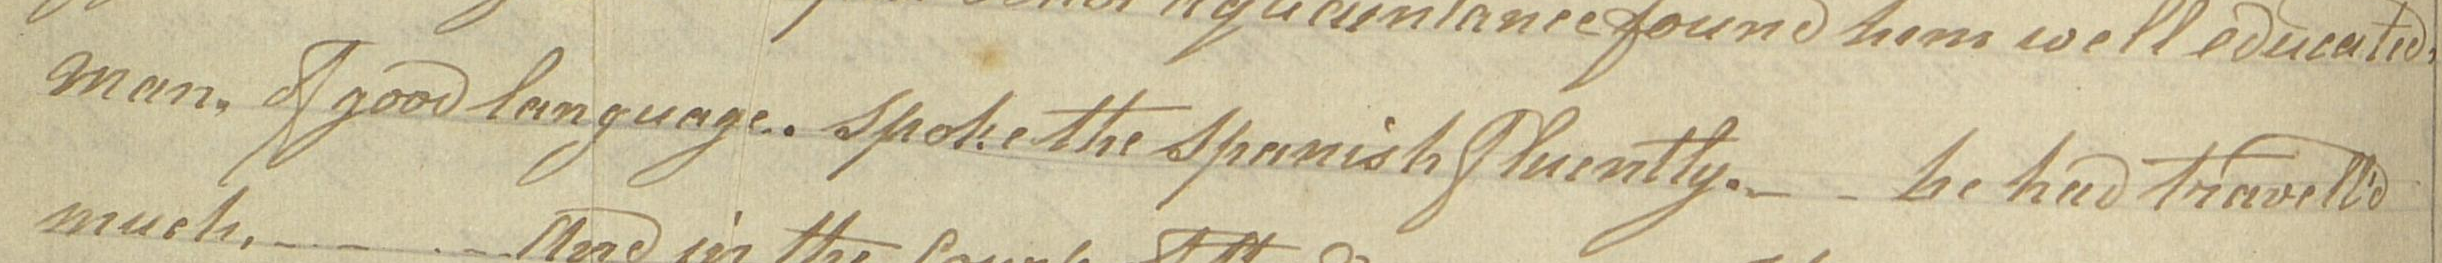man of good language. Spoke the Spanish fluently. he had travell'd
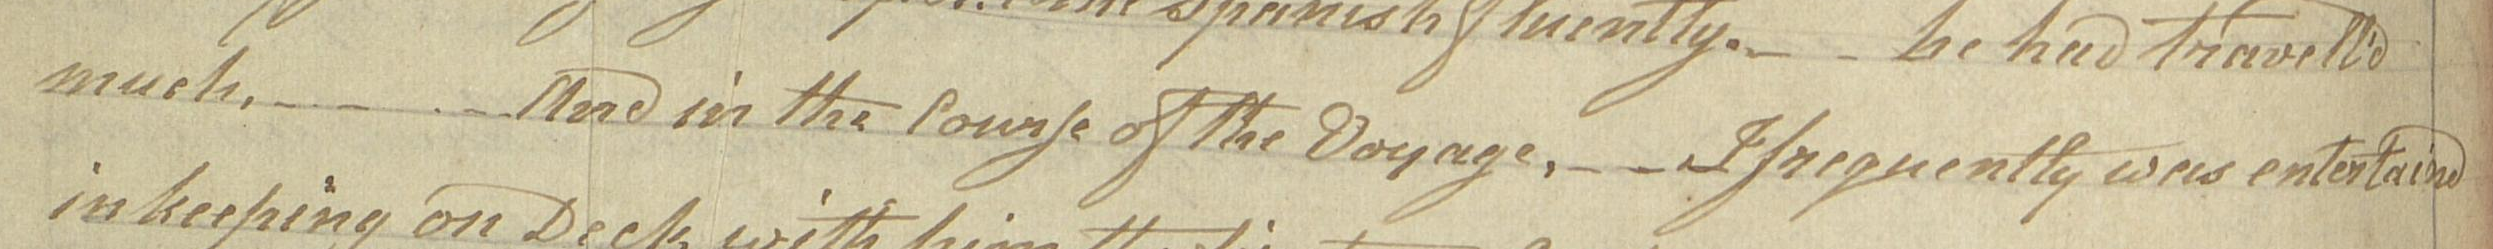much. And in the Course of the Voyage, I frequently was entertained
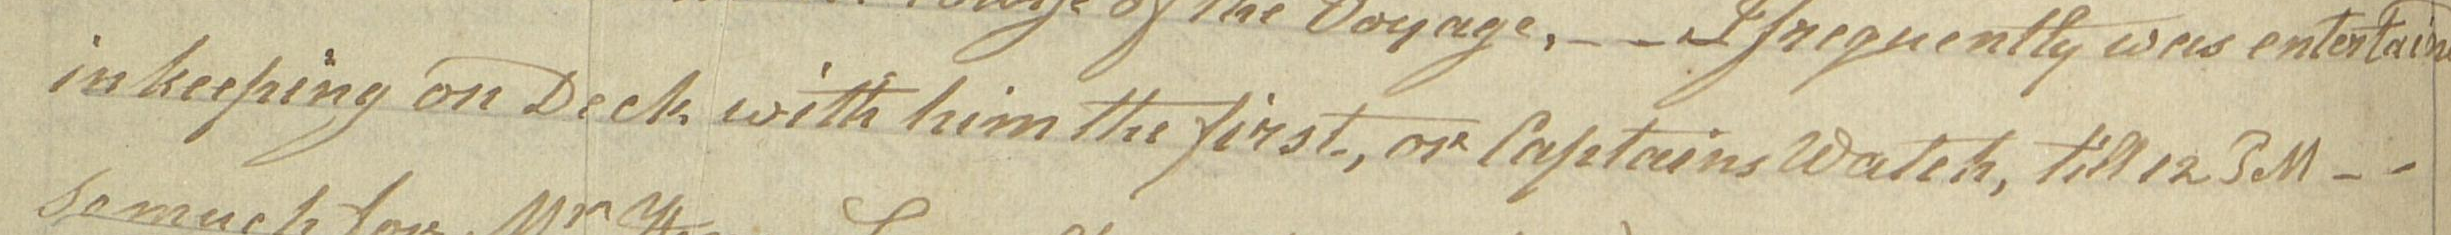in keeping on Deck with him the first, or Captains Watch, till 12 Pell
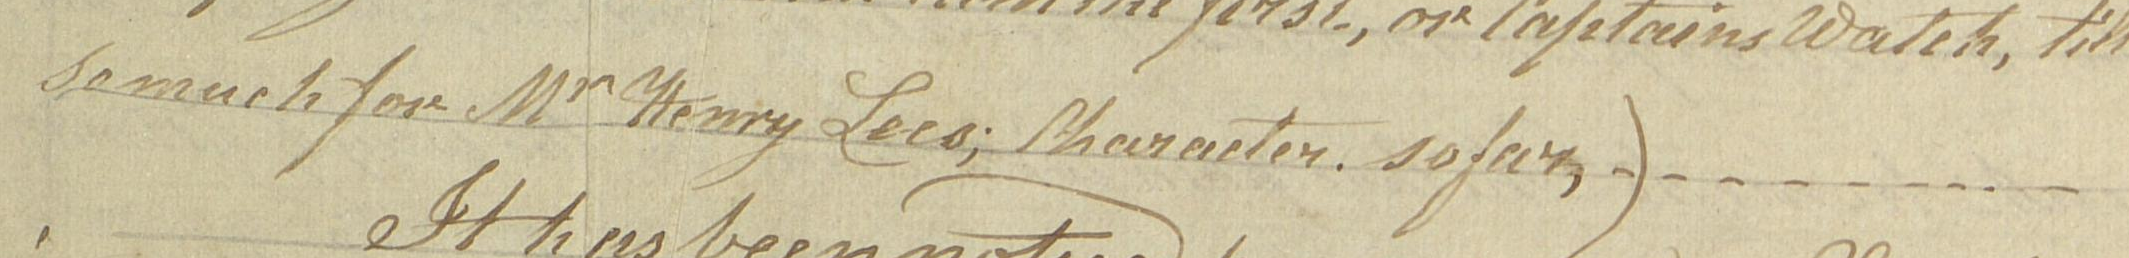So much for M^r. Henry Lees; Character so far,)
